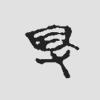𠭁
